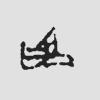爲
